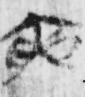寅
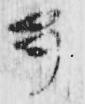邑
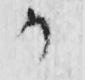人
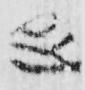疋
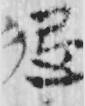○（起）
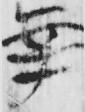辛
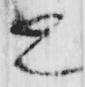巳
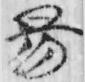昜（陽）
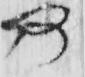尹
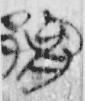○（宛）
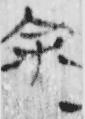余
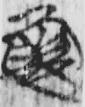婁
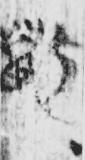○（狐）
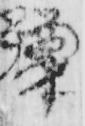○（复）
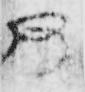尹
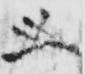之
